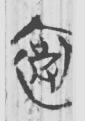被
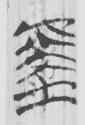{虍㚔}
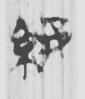{糸妟}
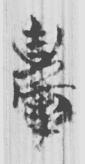{克革}
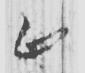㠯（以）
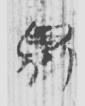眾
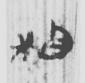相
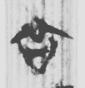向
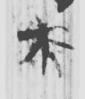夫
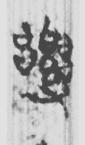𠧏（亂）
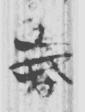者
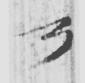乃
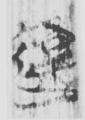違
